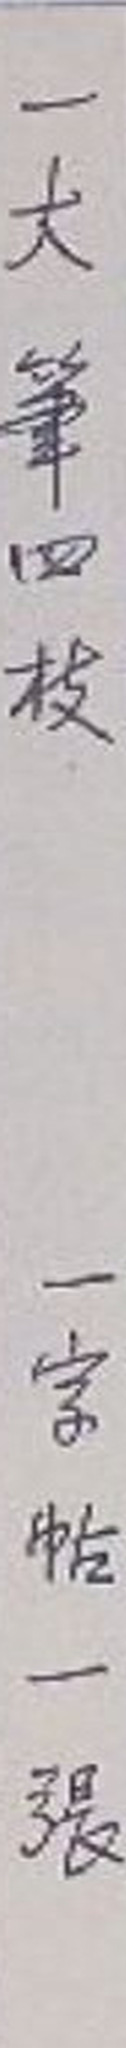一大筆四枝一字帖一張
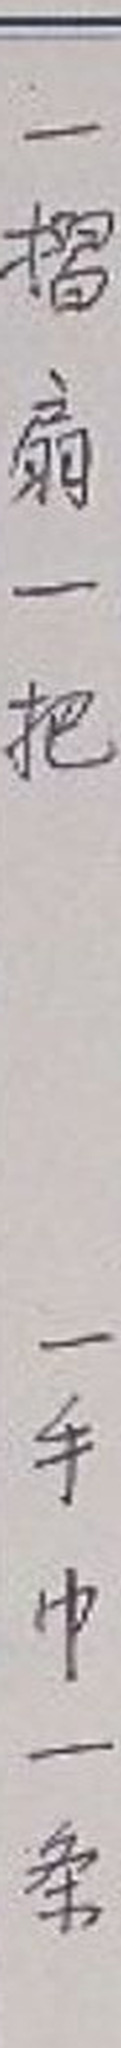一摺扇一把一手巾一条
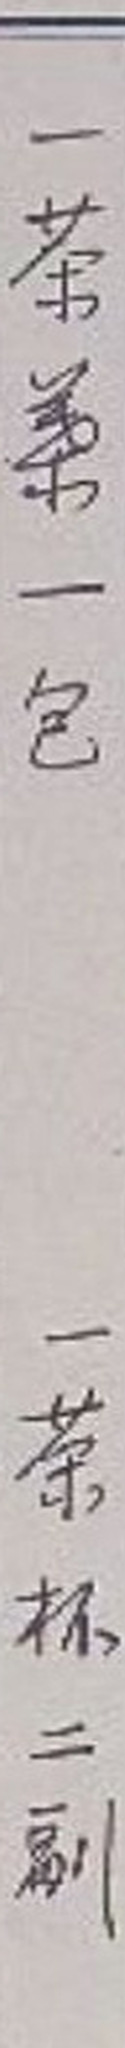一茶葉一包一茶杯二副
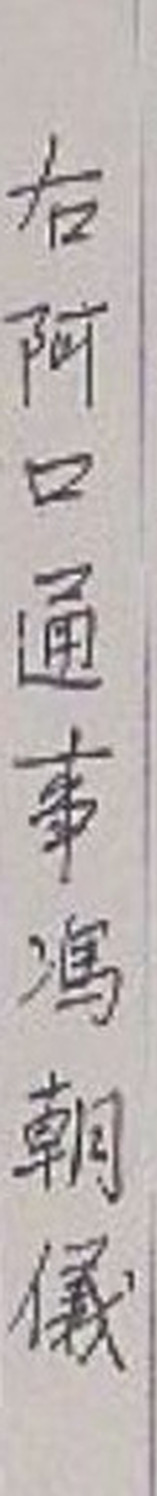右阿口通事馮朝儀

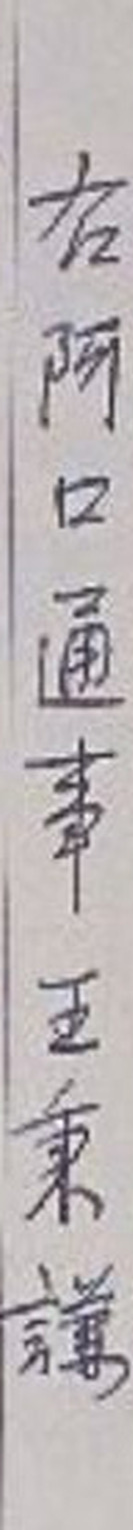右阿口通事王秉謙
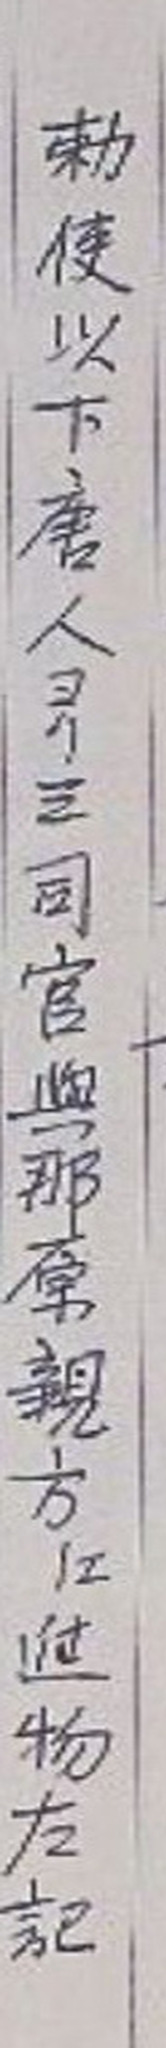勅使以下唐人より三司官与那原親方え進物左記
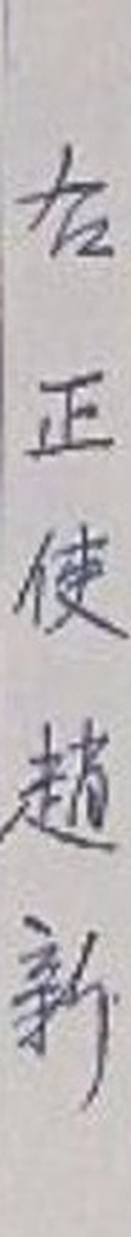右正使趙新
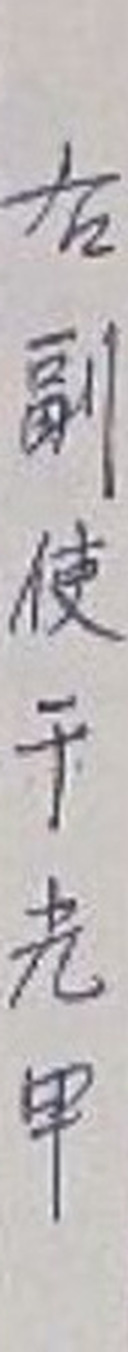右副使干光甲
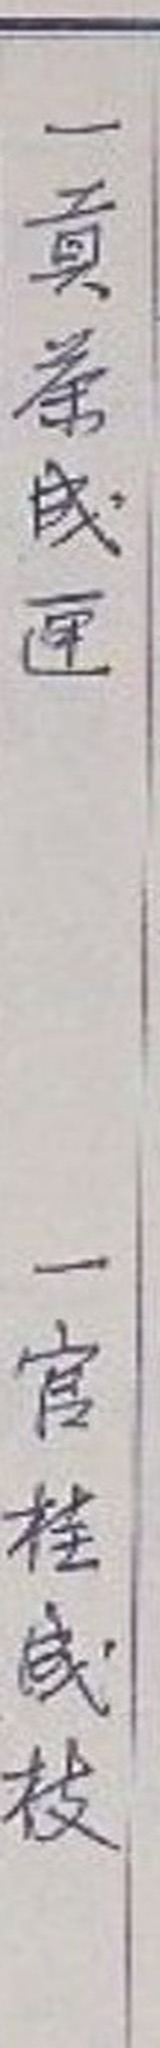一貢茶成匣一官桂成枝
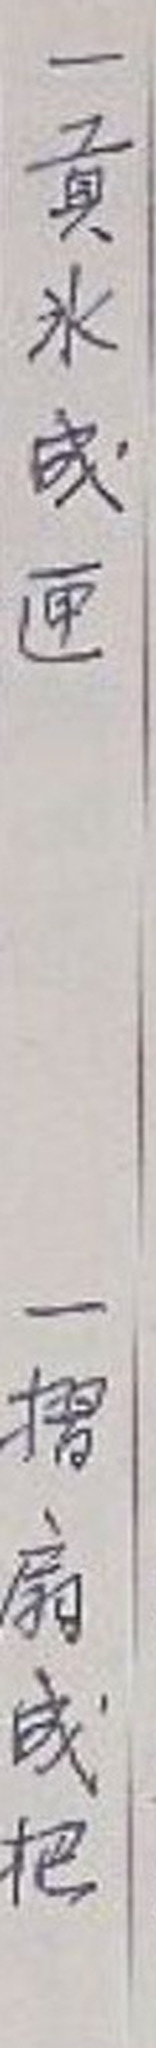一貢氷成匣一摺扇成把
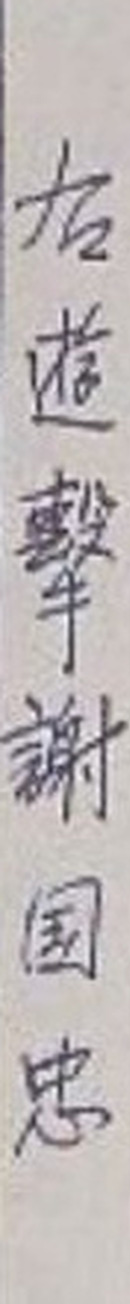右遊撃謝国忠
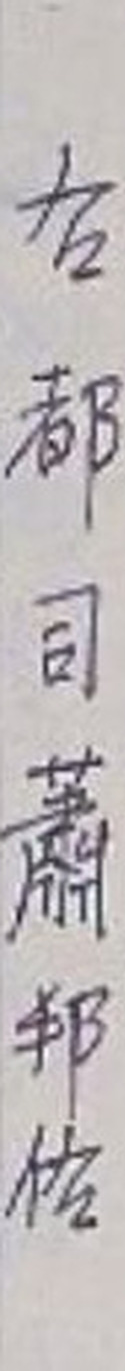右都司蕭邦佑
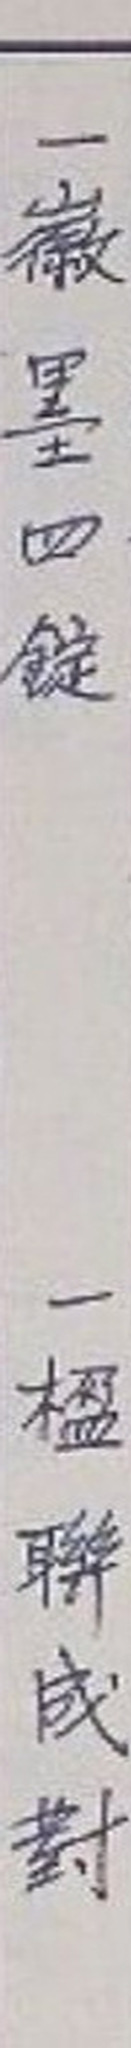一徽墨四錠一楹聯成対
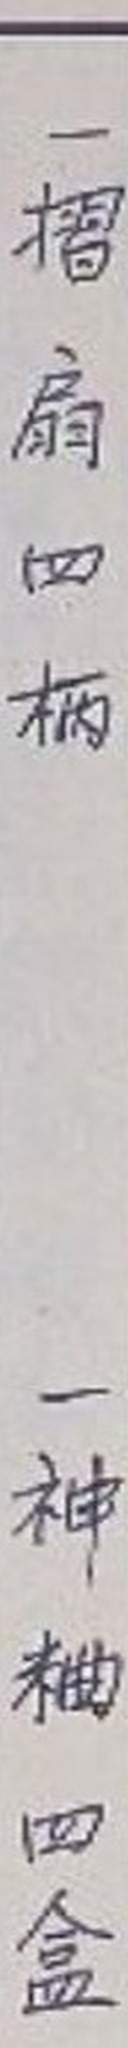一摺扇四柄一神粬四盒
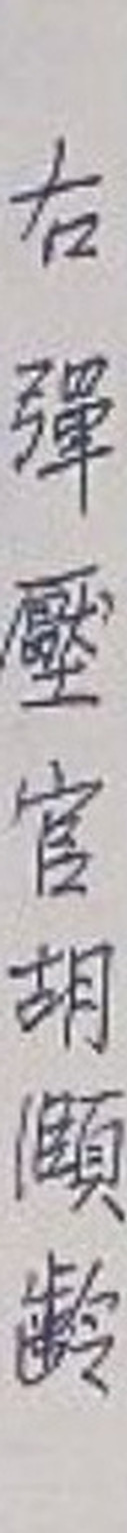右弾圧官胡頥齢
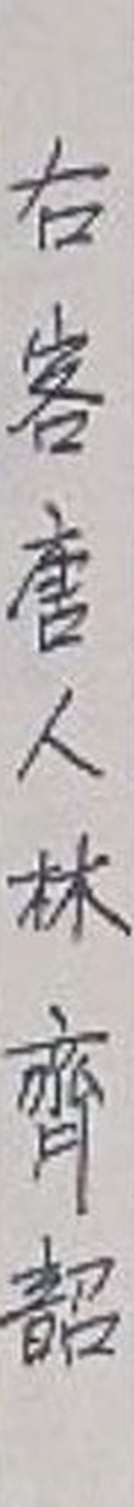右客唐人林齊韶
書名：支那冊封使来琉諸記 下巻
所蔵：University of the Ryukyus Library
